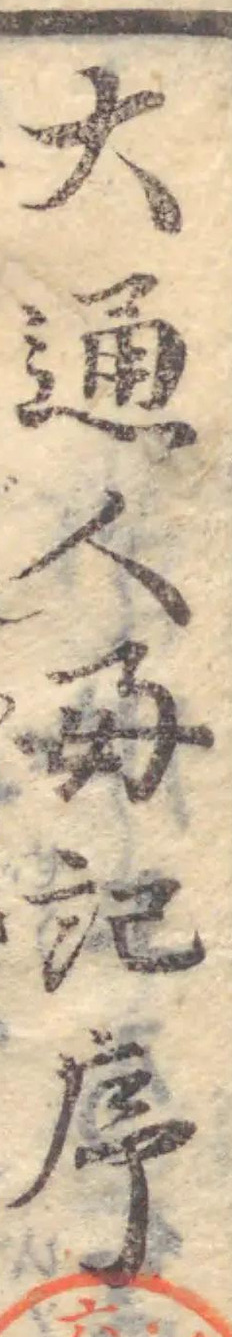大通人好記序
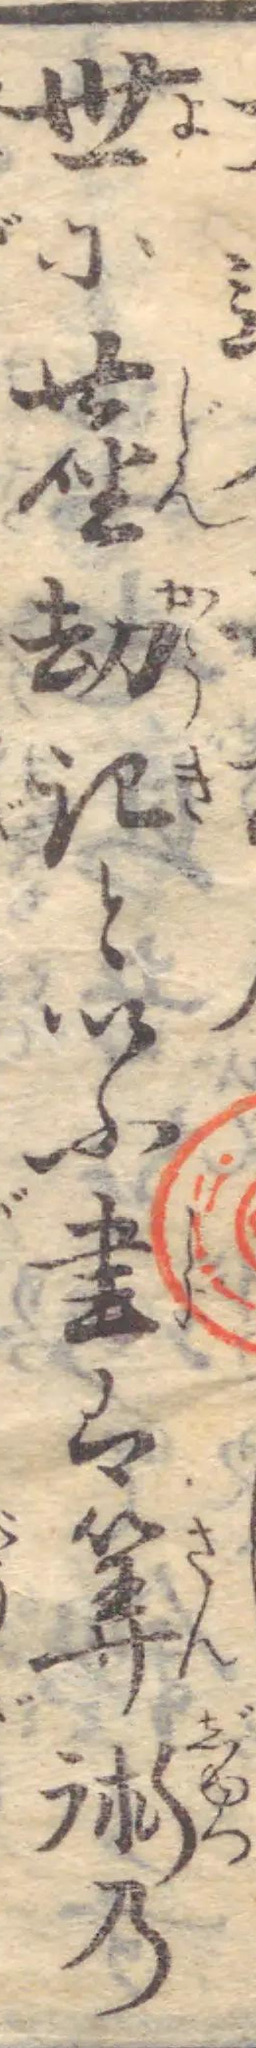世に塵劫記といふ書は算術の
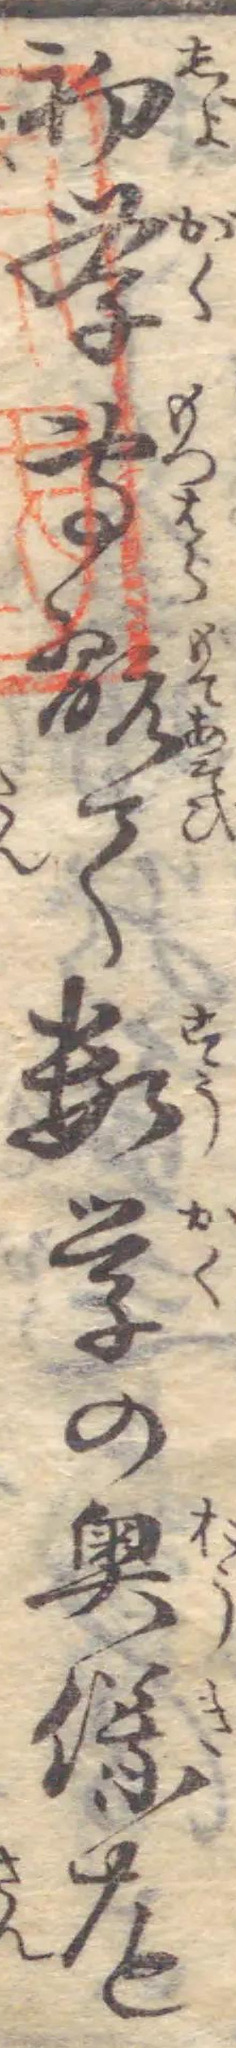初学専翫て数学の奥儀を
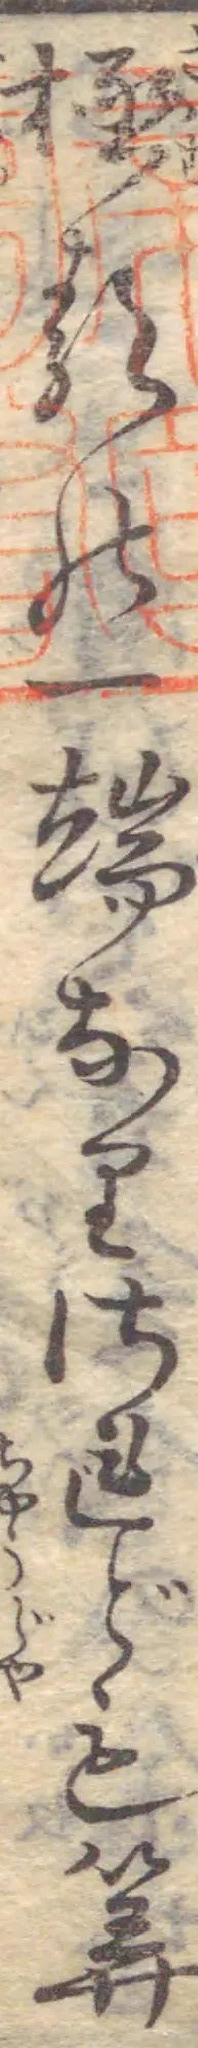極るの一端なりされども算
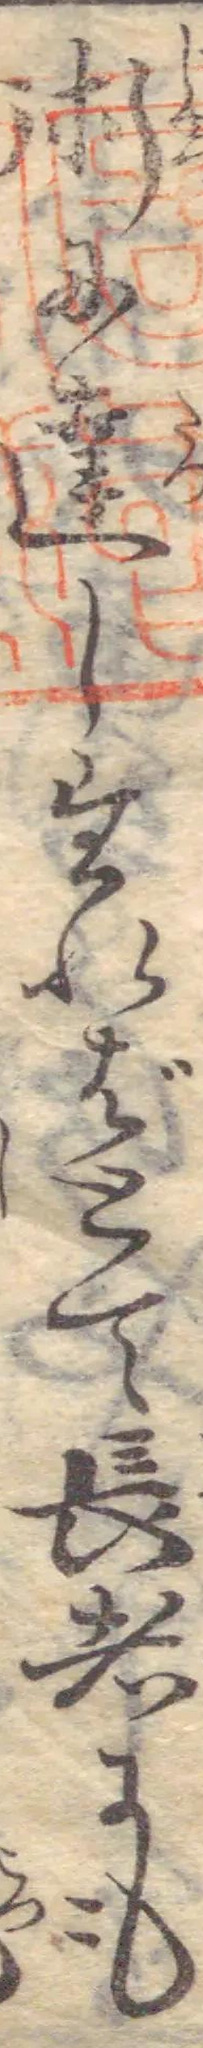術に達したればとて長者にも
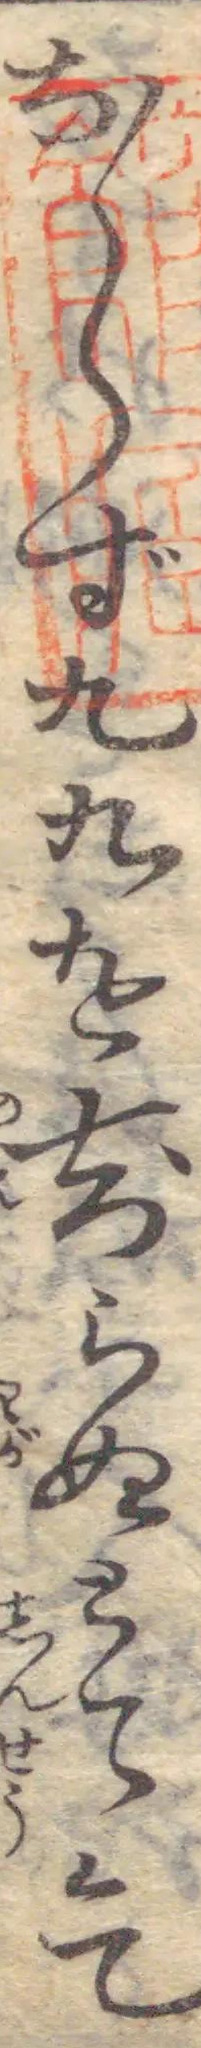ならず九九を知らぬとて乞
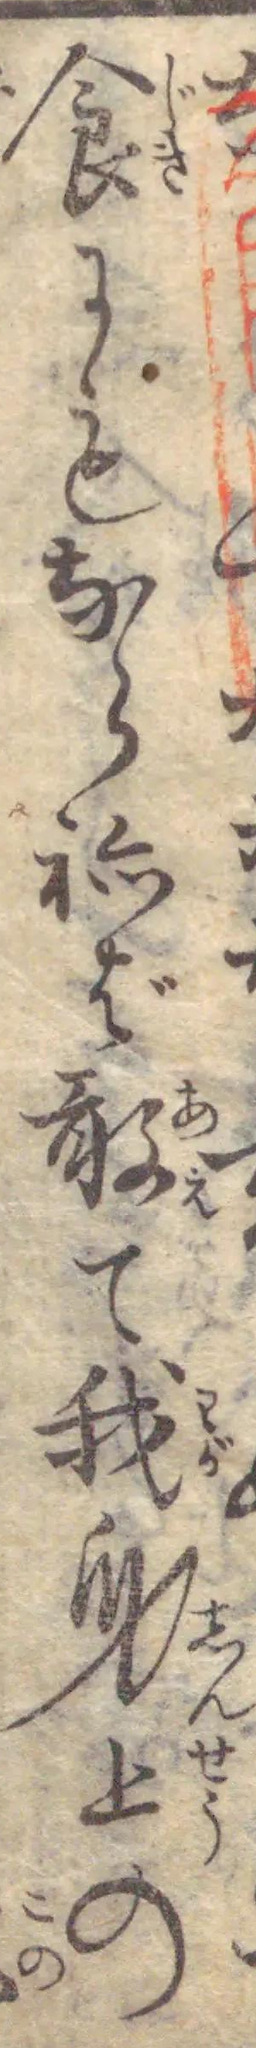食にもならねば敢て我身上の
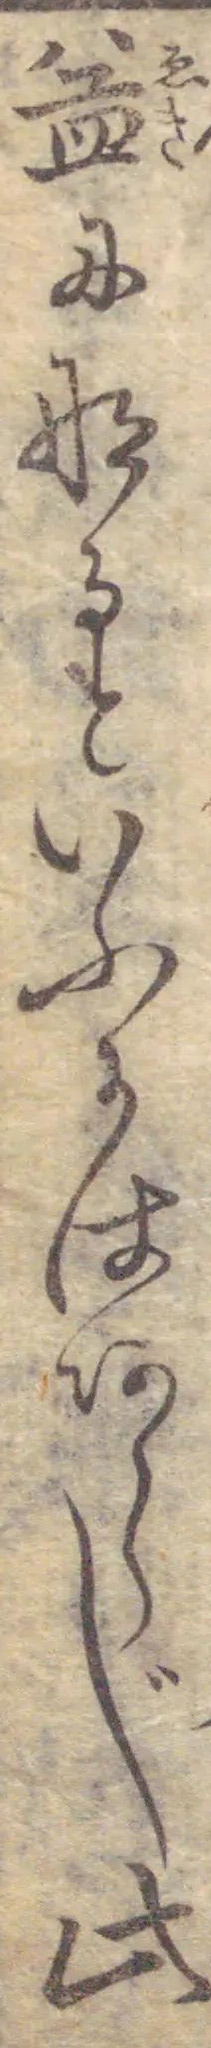益になるといふにはあらじ此

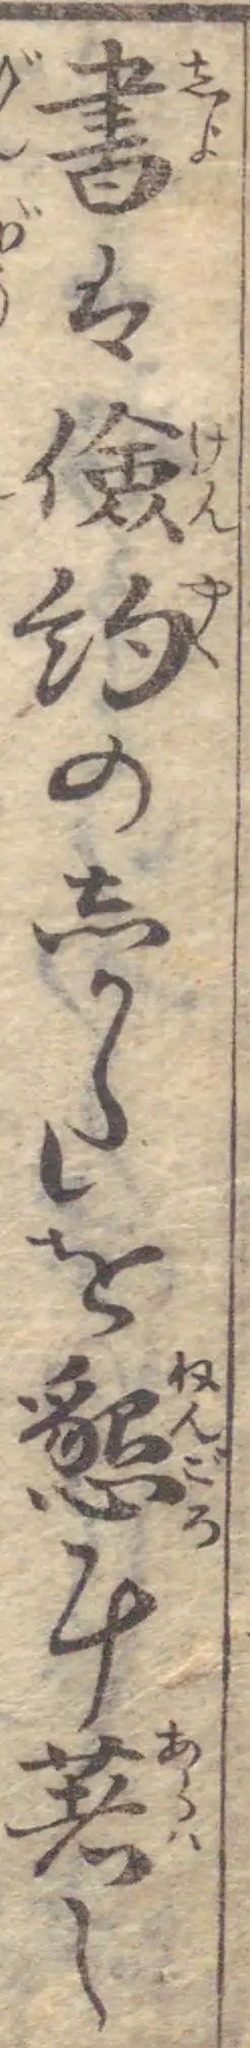書は倹約のしかたを懇に著し
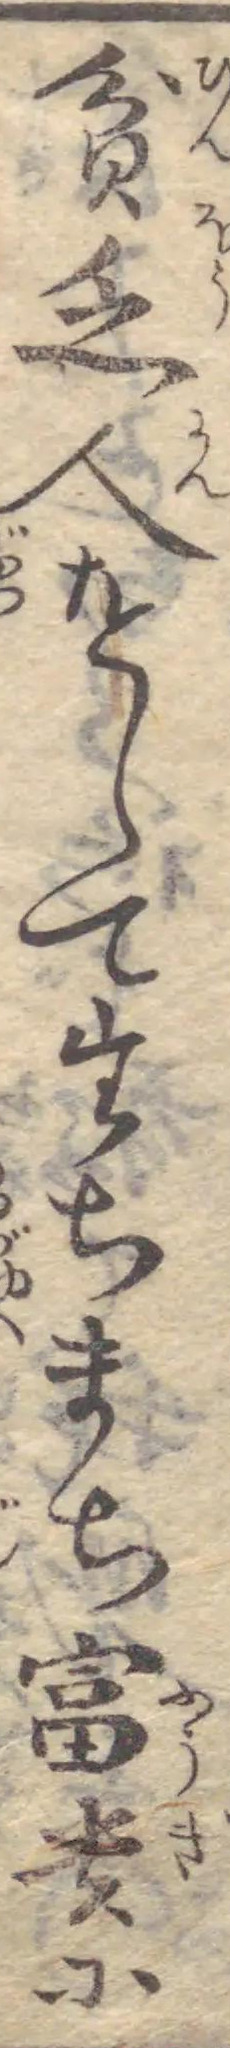貧乏人をしてたちまち富貴に
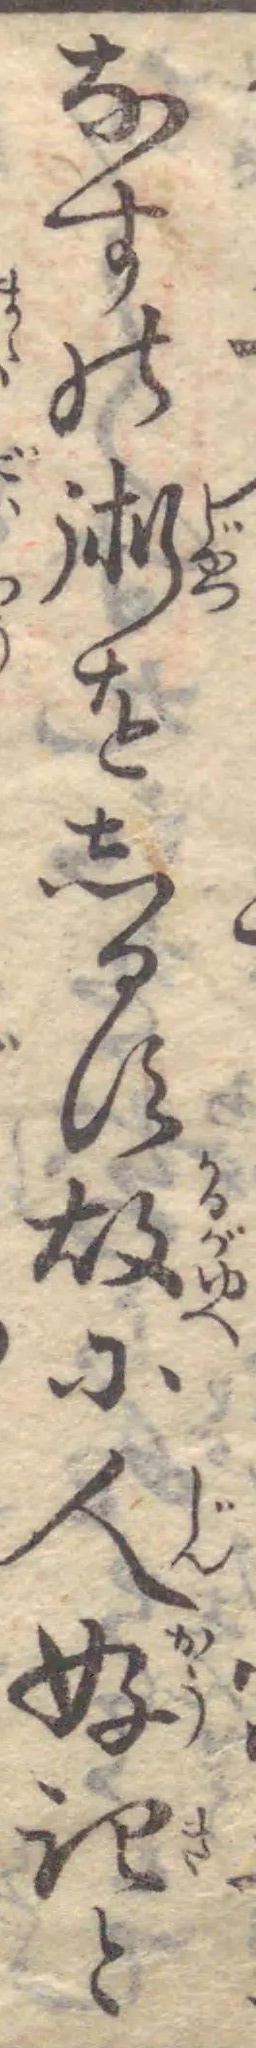なすの術をしるす故に人好記と
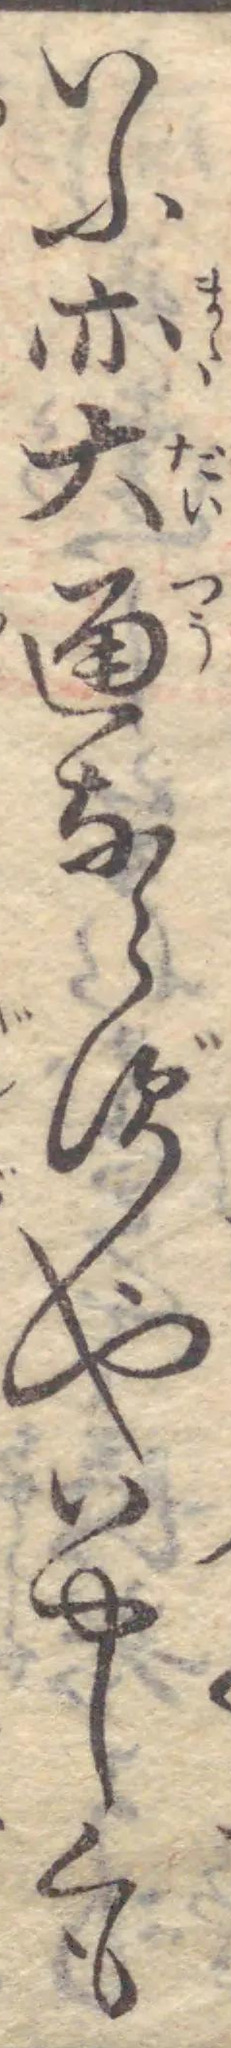いふ亦大通ならずやいやしくも
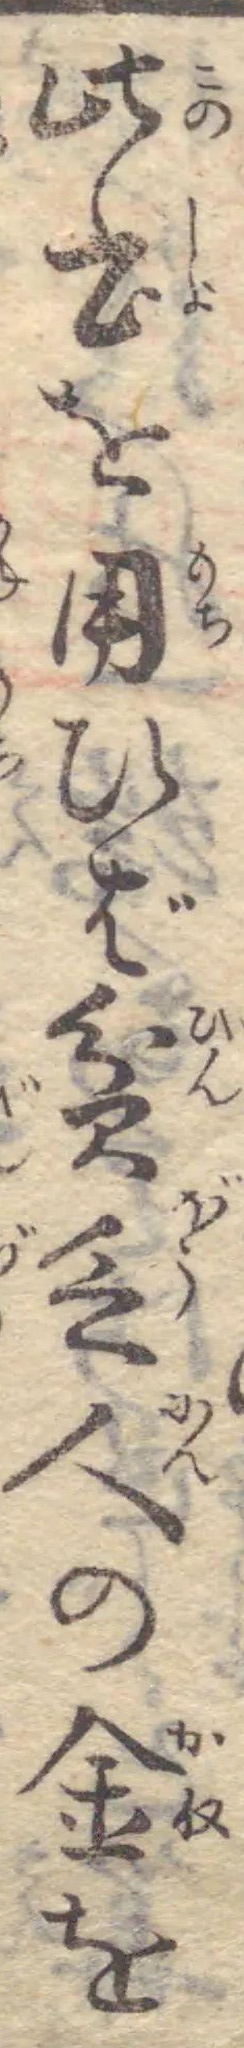此書を用ひば貧乏人の金を
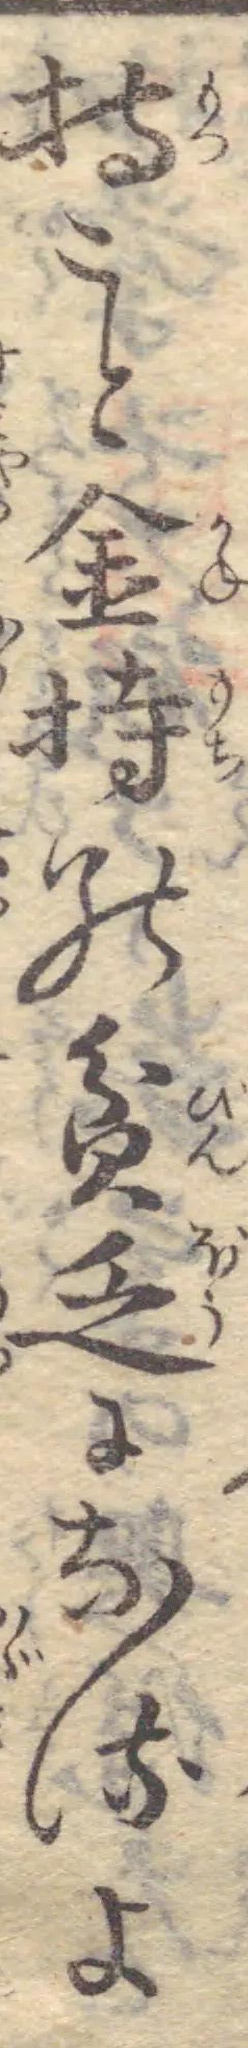持こと金持の貧乏になるよ
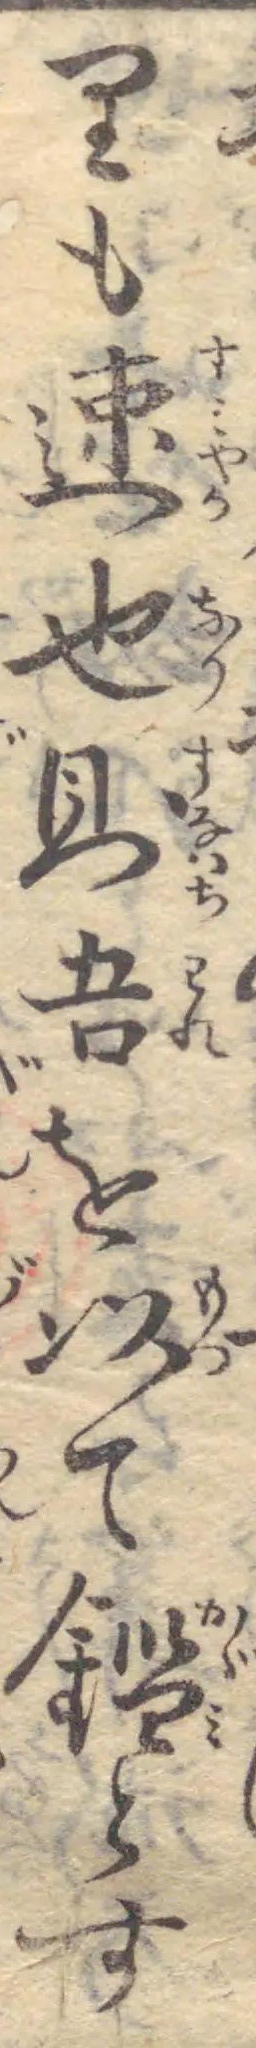りも速也則吾を以て鑑とす
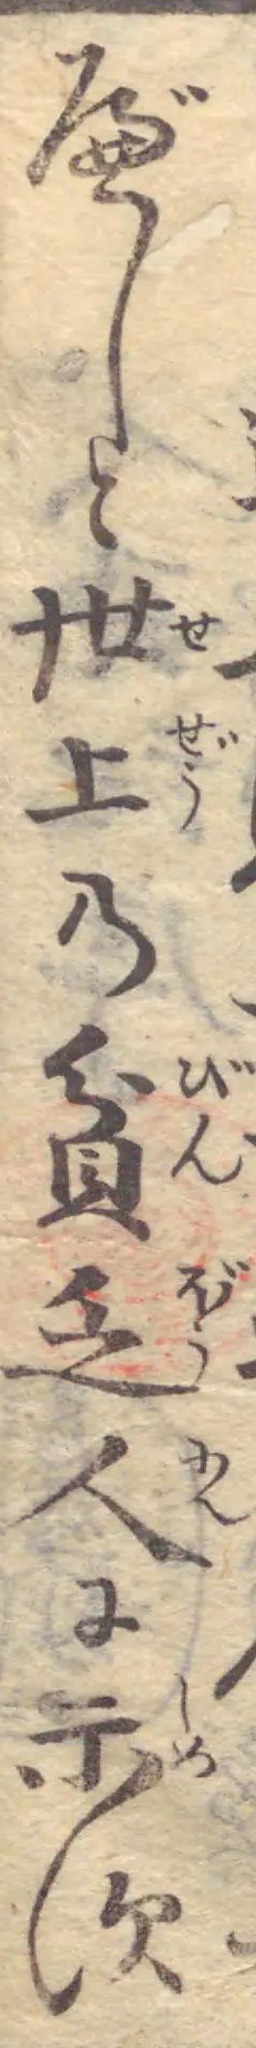べしと世上の貧乏人に示す
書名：大通人好記
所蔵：国立国会図書館 National Diet Library, JAPAN
